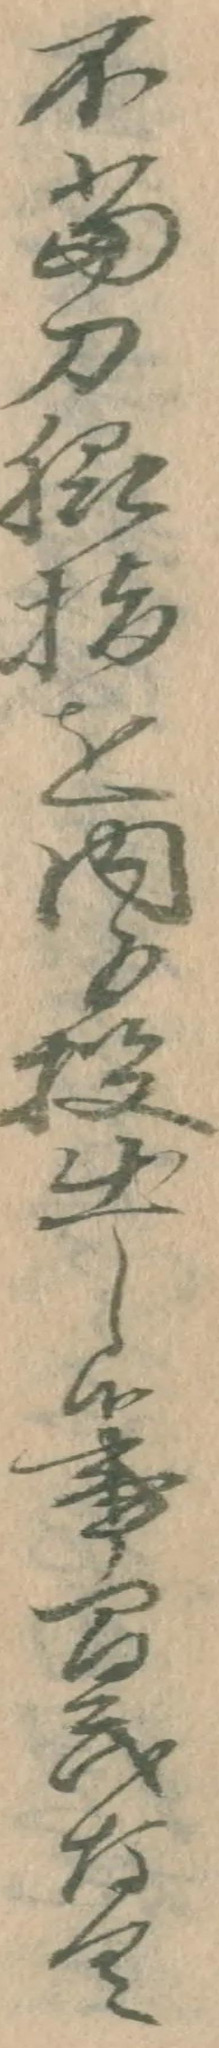不当刀脇指を内ゟ投出し候事間茂な具
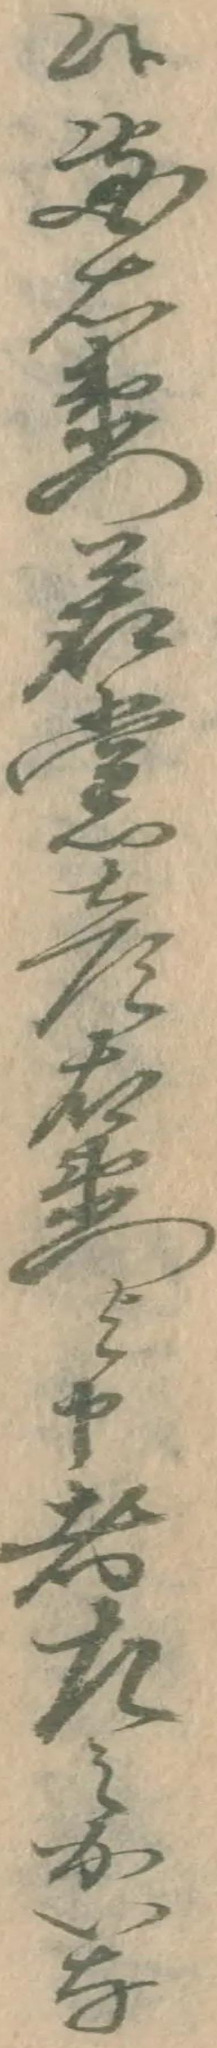候甚右衛門若党彦右衛門与申者左之かいな
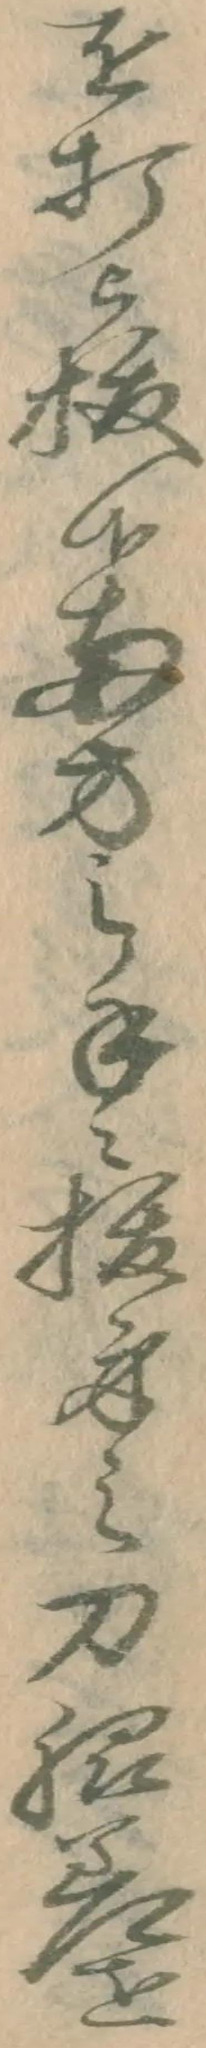を打被抜候両方之手に抜身之刀脇差を

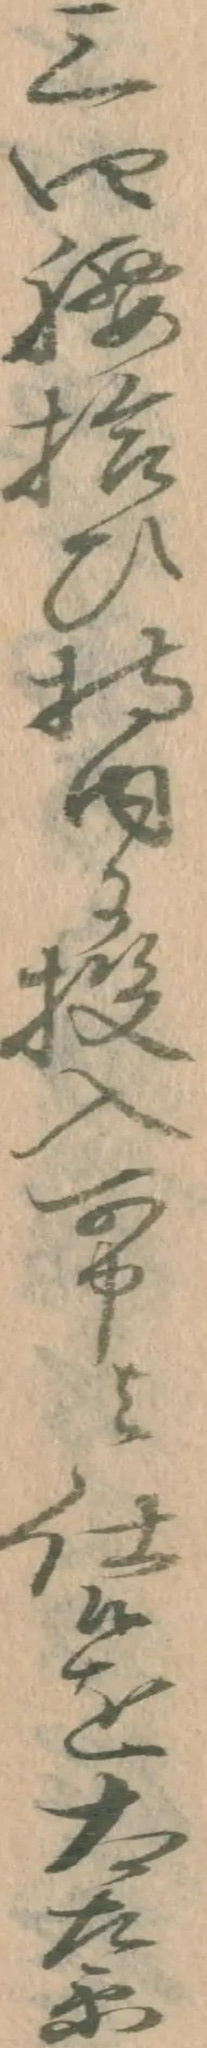三四腰拾ひ持内尓投入可申与仕候を太左衛
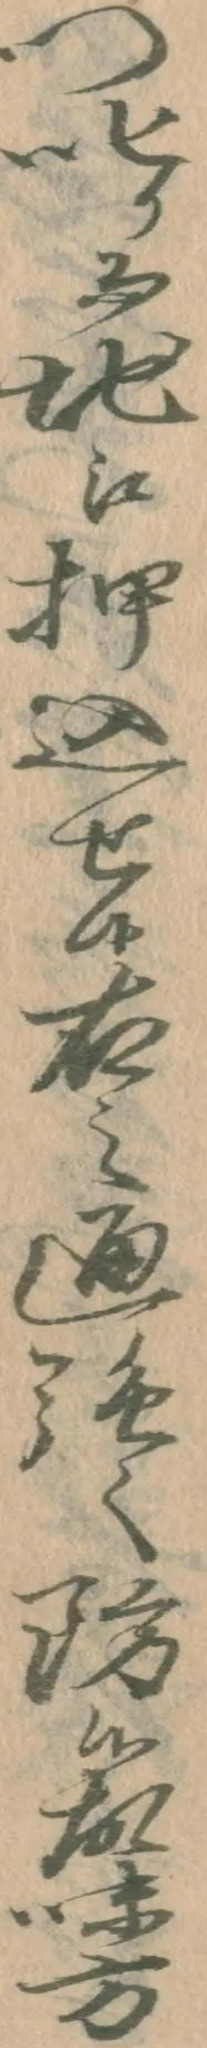門叱り而地江押込せ候右之通強く防候故味方
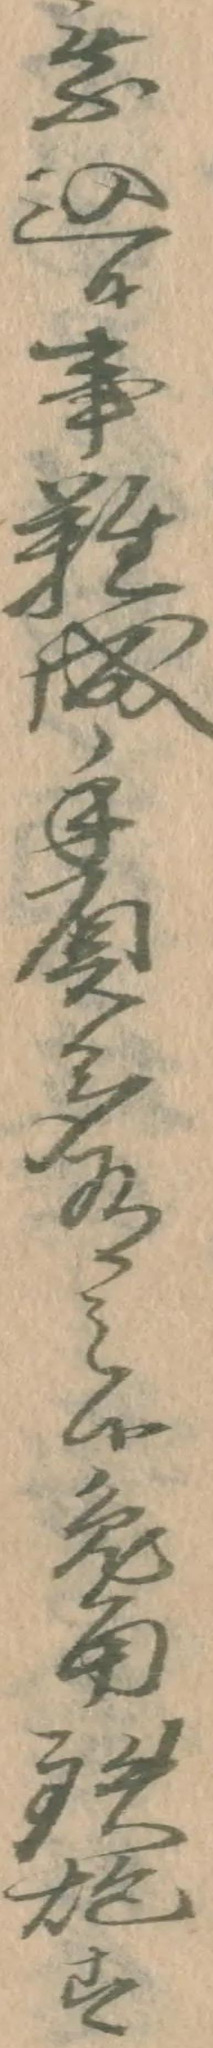乗込候事難成手負多有之候兎角鉄炮春
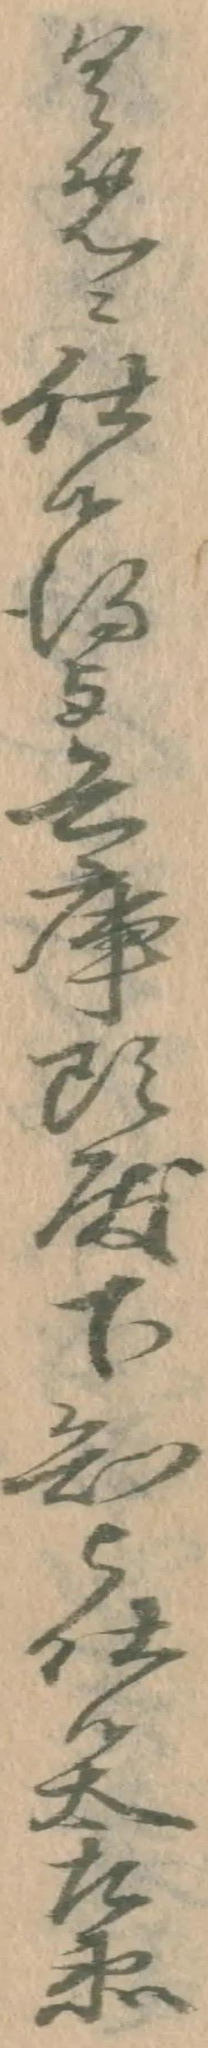具免に仕候得与兵庫頭殿下知被仕候太左衛
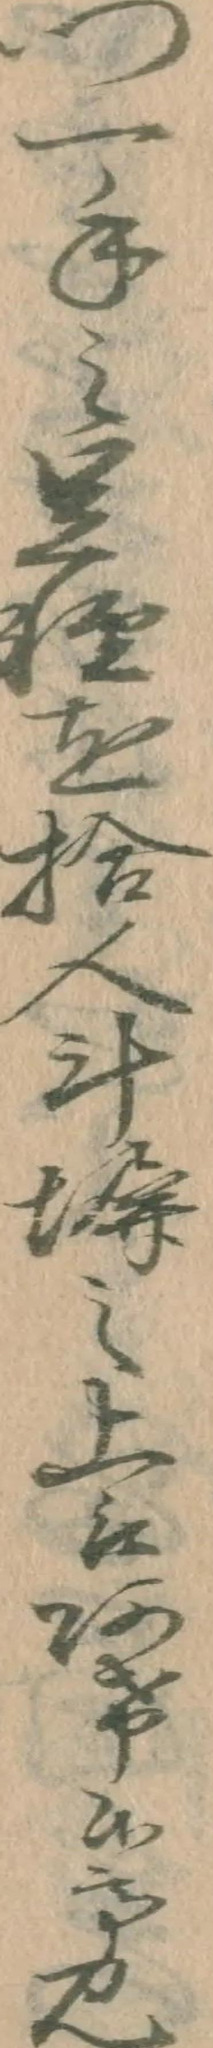門一手之足軽を拾人斗塀之上江阿希候亭見
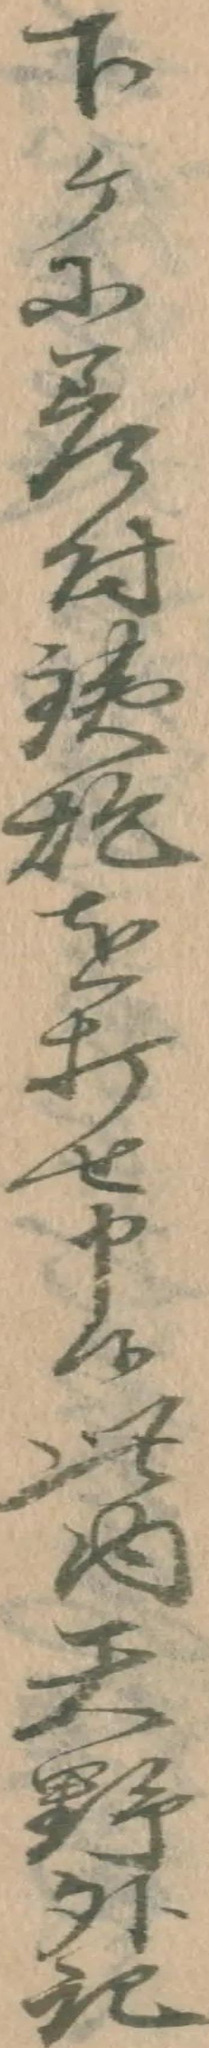下け尓差付鉄炮を打せ申候此内天野外記
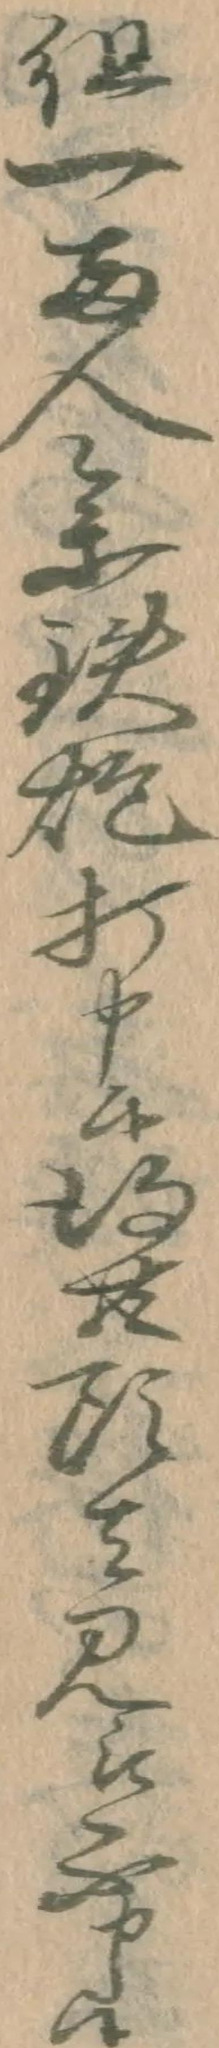組一両人参鉄炮打申候得共頭者見江ふ申候
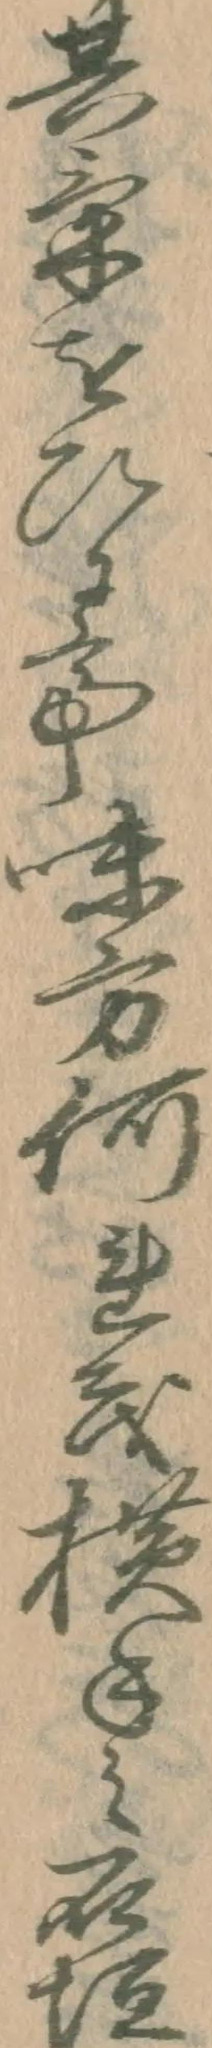其気をひ尓亭味方何連茂横手之石垣
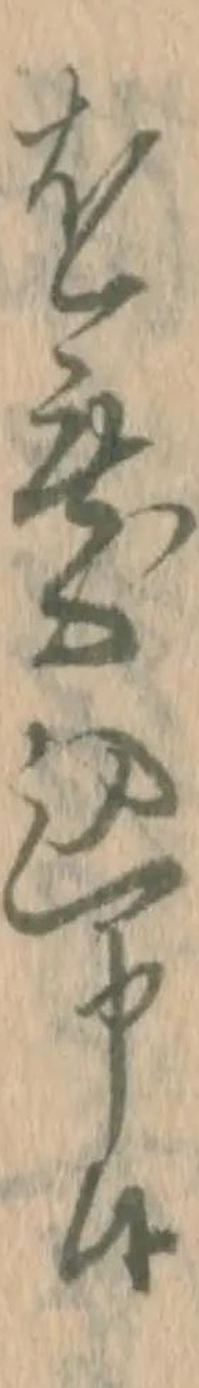を乗込申候
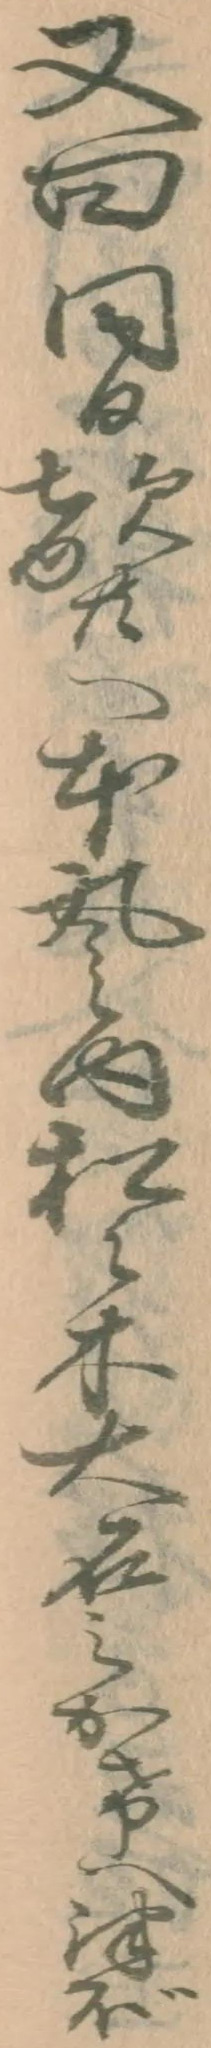又曰同日敵共へ本丸之内松之木大名之か希へ津ぼ
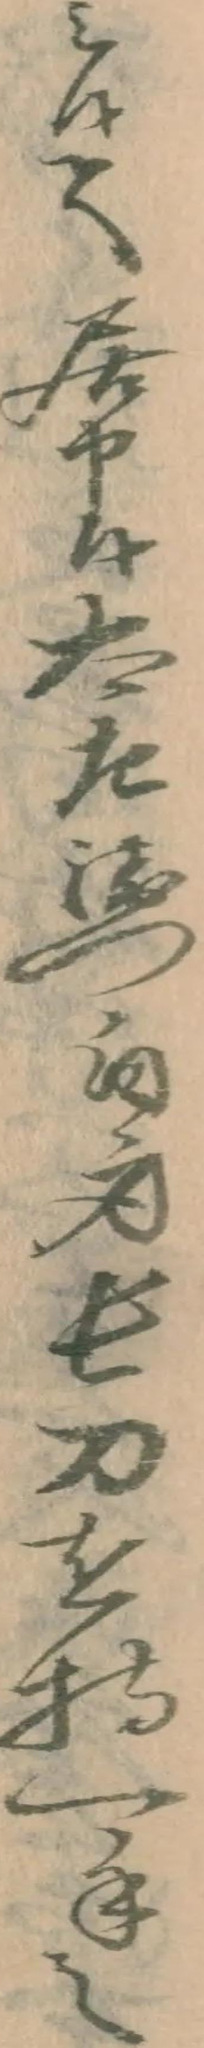み候て居申候太左衛門自身長刀を持一手之
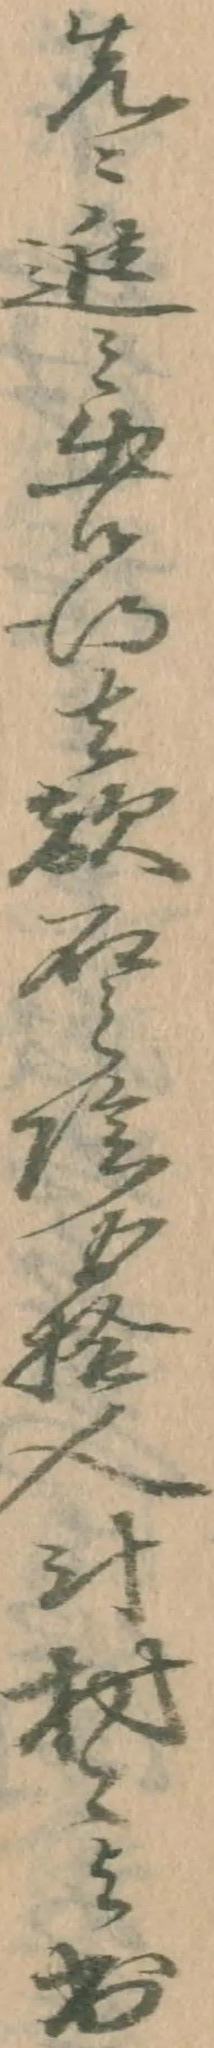先に進み出候得者敵石之陰ゟ十人斗村々与出
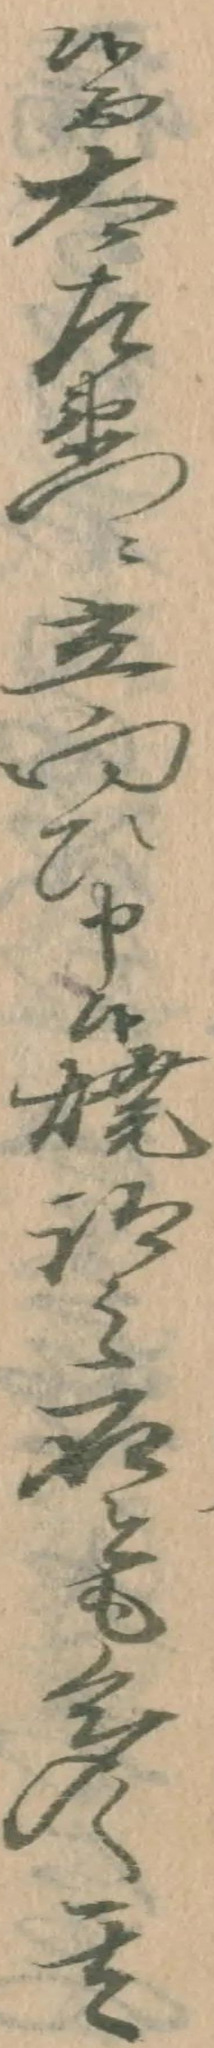候而太左衛門に立向ひ申候焼跡之石とも多く其
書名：切支丹御退治記 49巻. [8]
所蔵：国立国会図書館 National Diet Library, JAPAN
